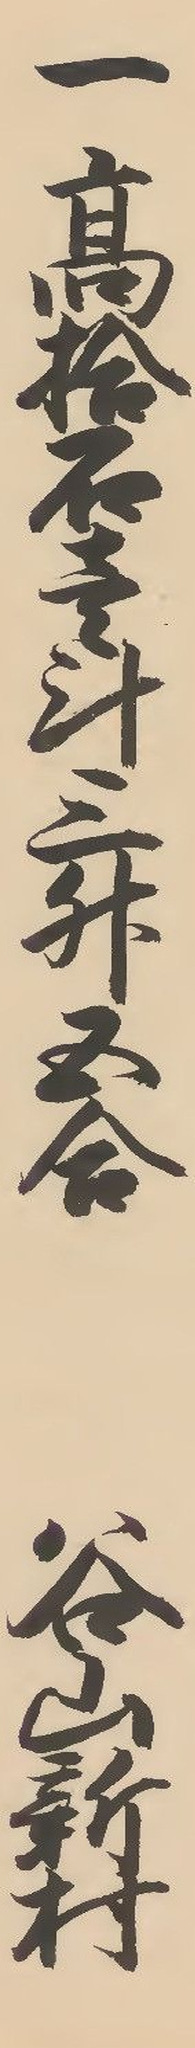一髙拾石壱斗三升五合谷山新村

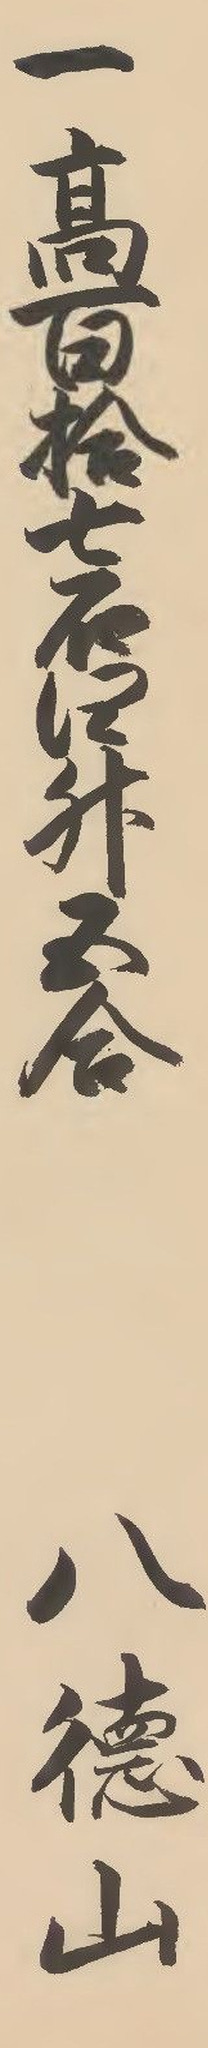一髙百拾七石四升五合八徳山
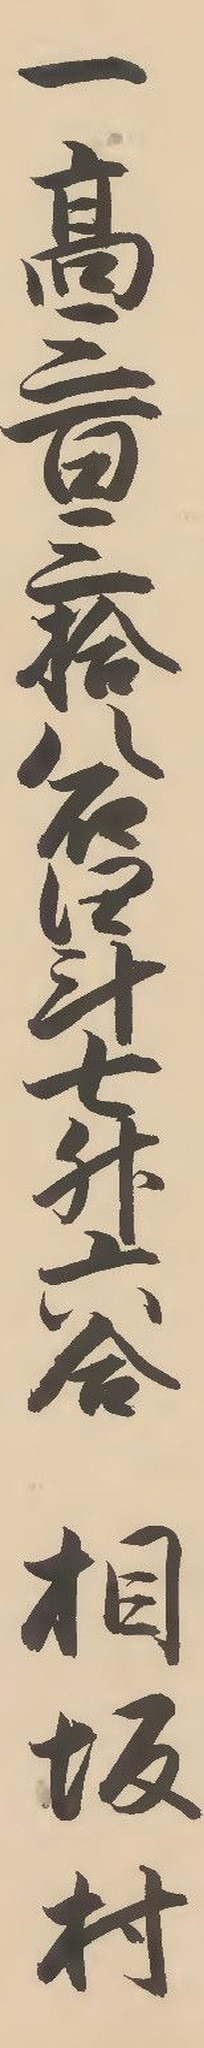一髙三百三拾八石四斗七升六合相坂村
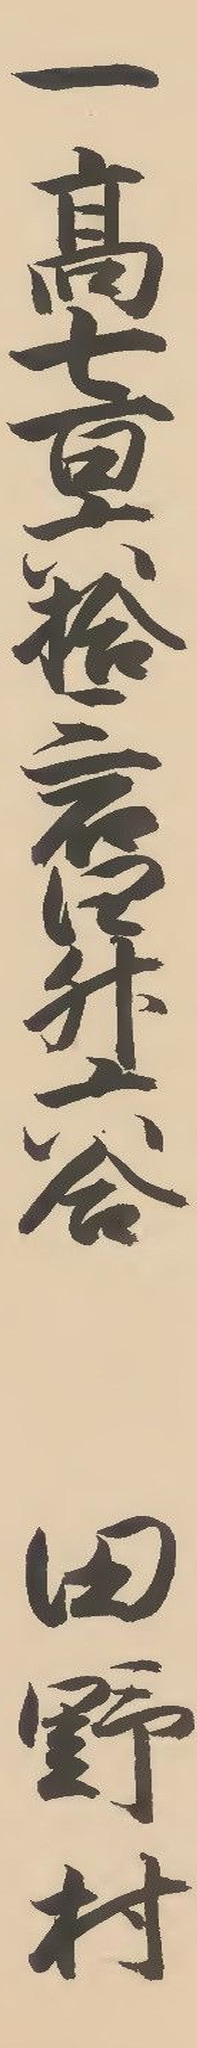一髙七百六拾三石四升六合田野村
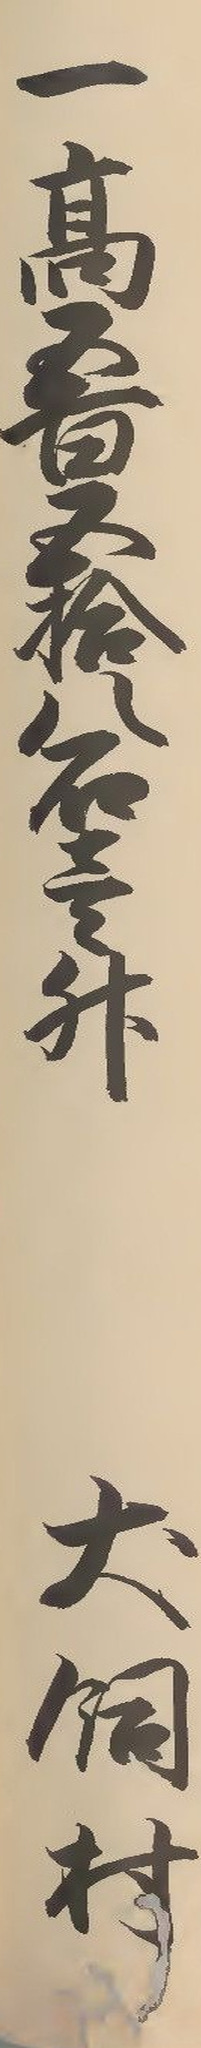一髙五百五拾八石壱升犬飼村
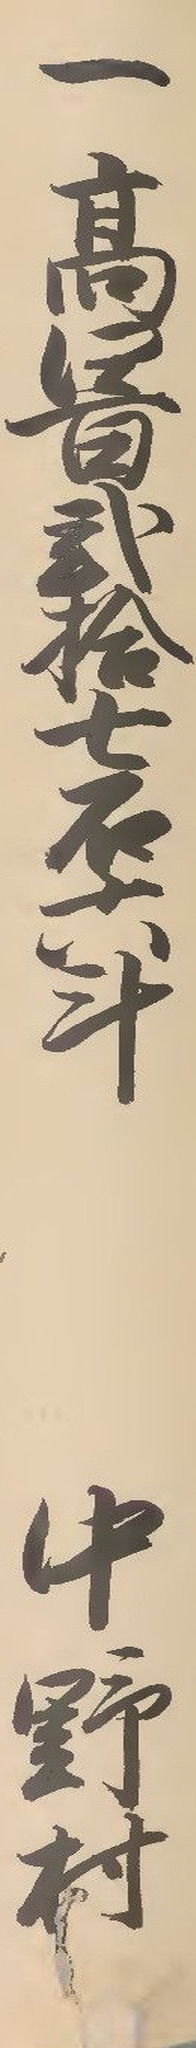一髙四百弐拾七石六斗中野村
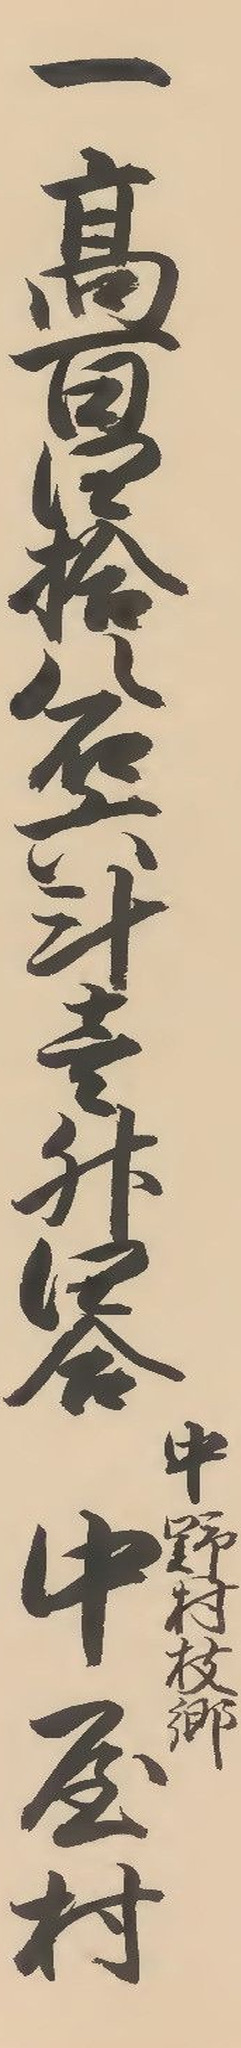一髙百四拾八石六斗壱升四合中屋村
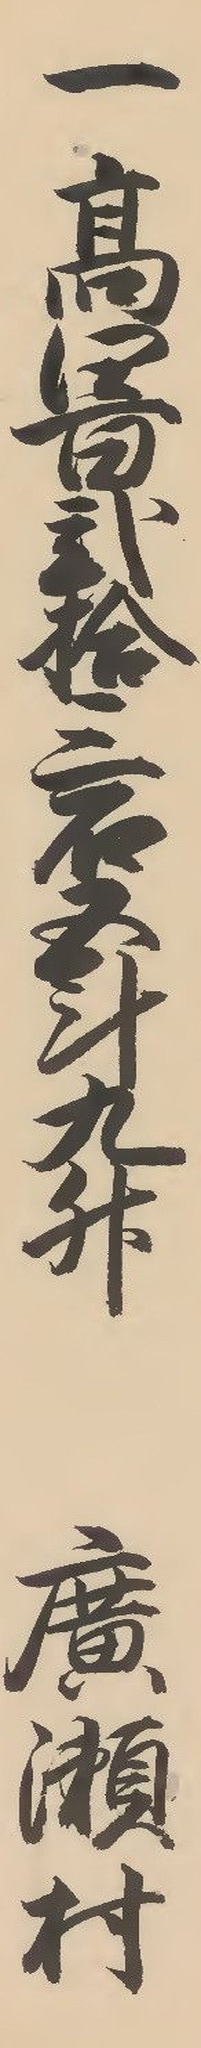一髙四百弐拾三石五斗九升廣瀬村
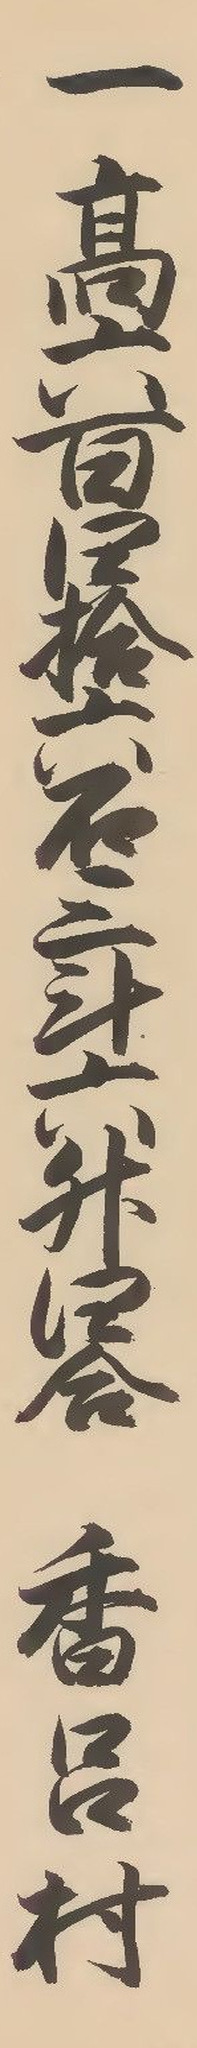一髙六百四拾六石三斗六升四合香呂村

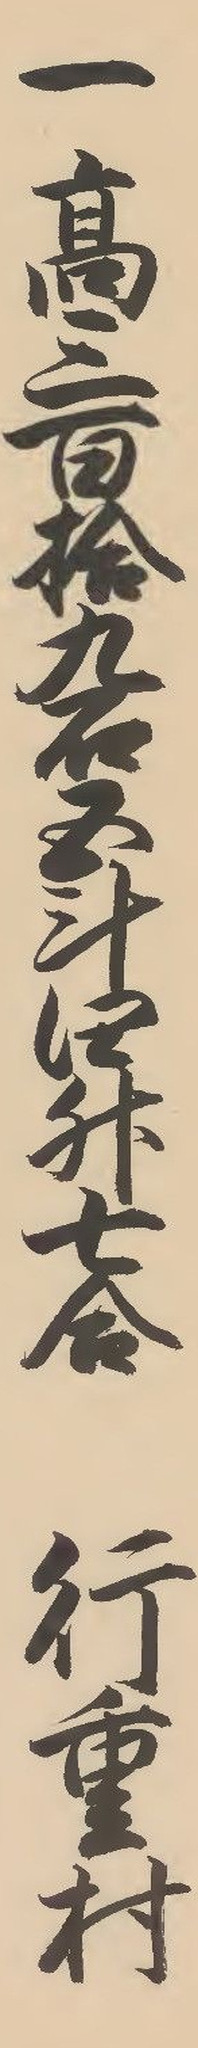一髙三百拾九石五斗四升七合行重村
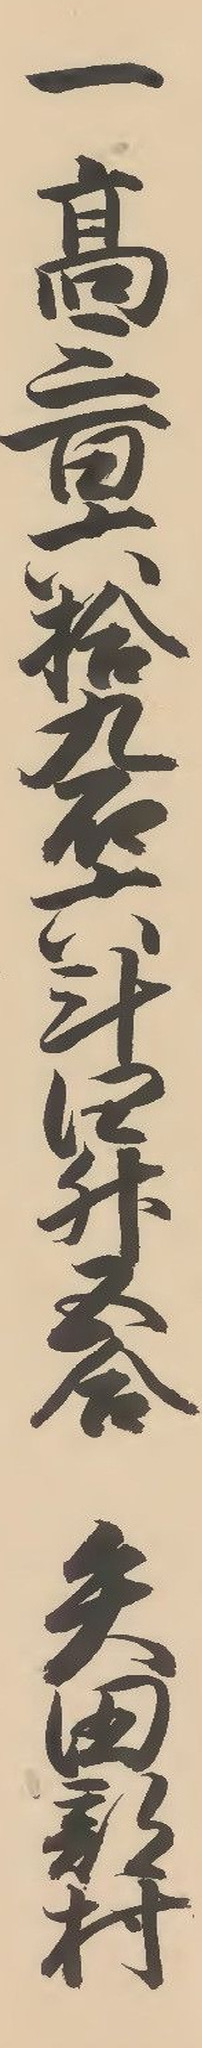一髙三百六拾九石六斗四升五合矢田部村
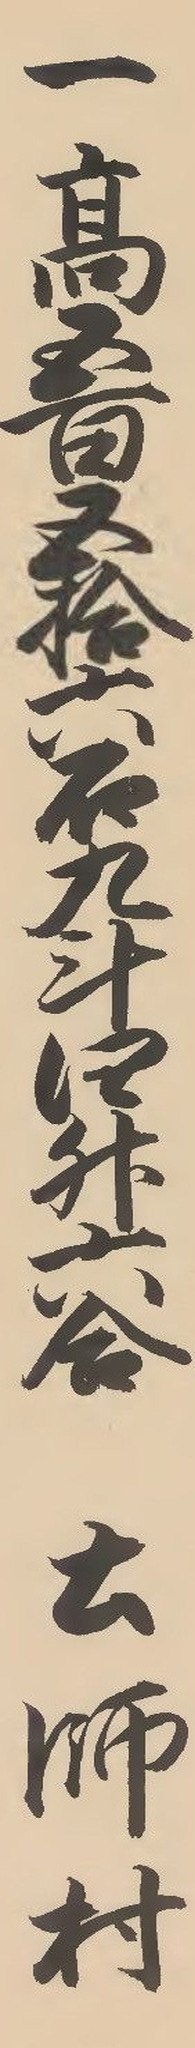一髙五百五拾六石九斗四升六合土師村
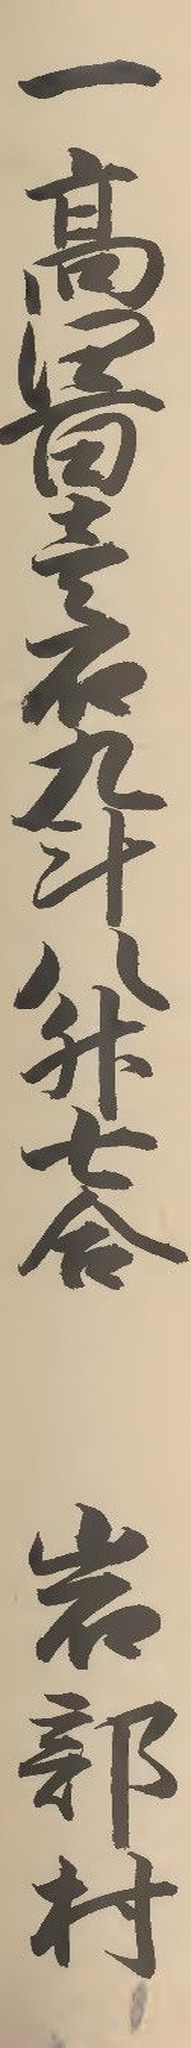一髙四百壱石九斗八升七合岩部村
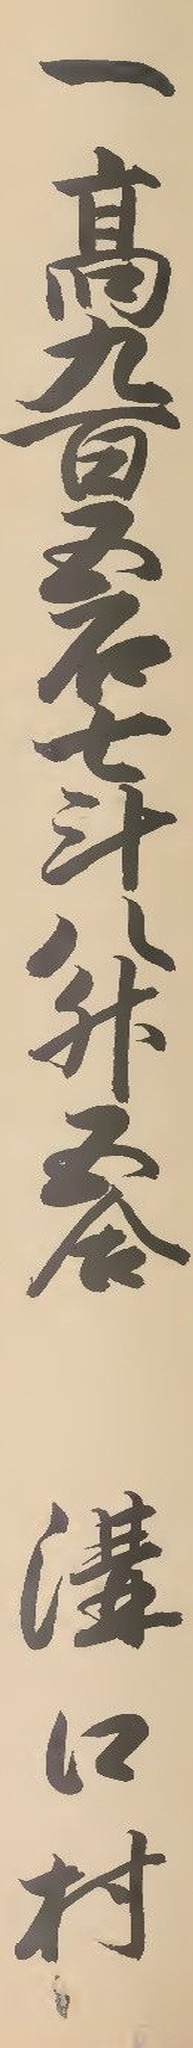一髙九百五石七斗八升五合溝口村
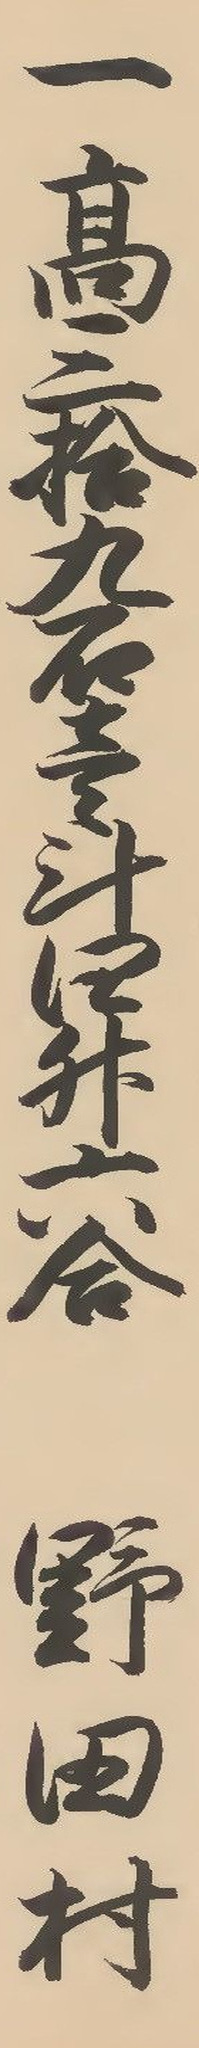一髙三拾九石壱斗四升六合野田村
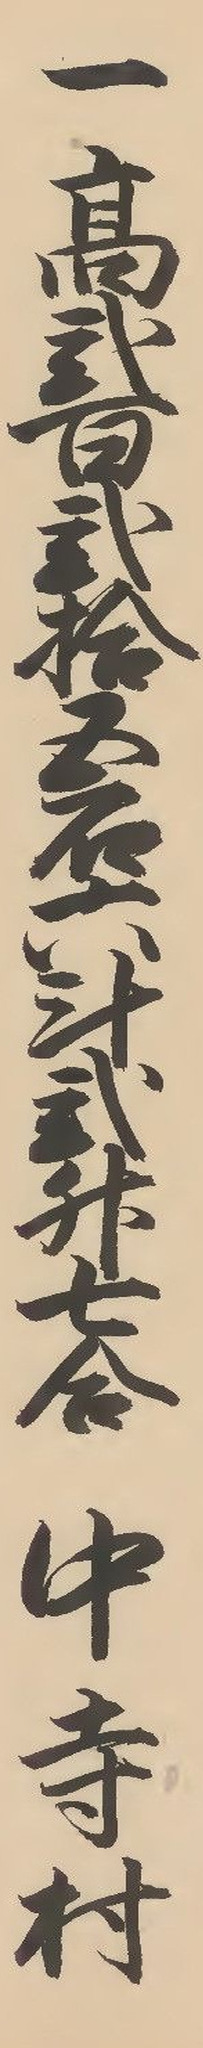一髙弐百弐拾五石六斗弐升七合中寺村
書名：播磨国郷帳
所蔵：国立公文書館 National Archives of Japan
